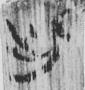此
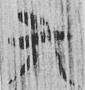亓（其）
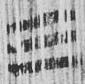三
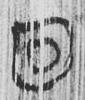回
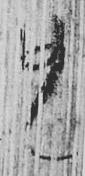也
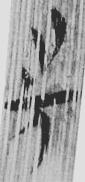先
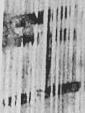王
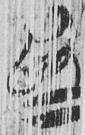爲
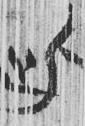此
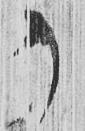人
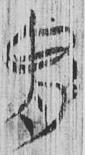{胃刀}（謂）
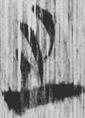之
